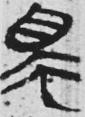蜀（獨）
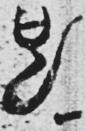也
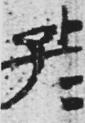孔子
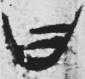曰
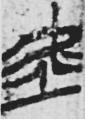○（吾）
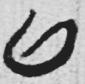㠯（以）
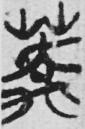○（葛）
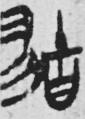○（覃）
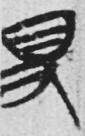○（得）
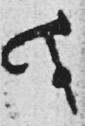氏
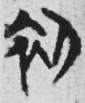初
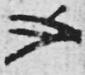之
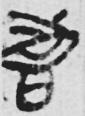○（詩）
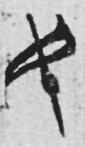民
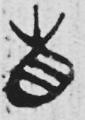眚（性）
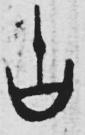古（固）
